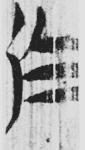於
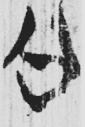公
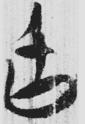身
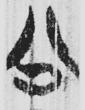公
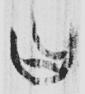曰
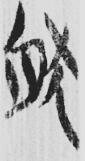○（然）
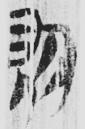則
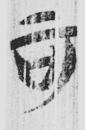可
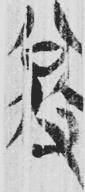敓（奪）
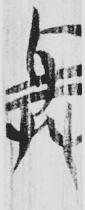與（與）
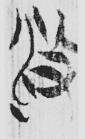汲（隰）
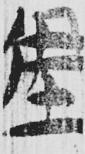○（朋）
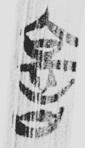答
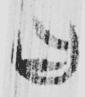曰
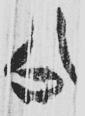公
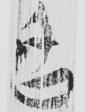身
